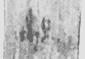廿
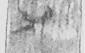五
